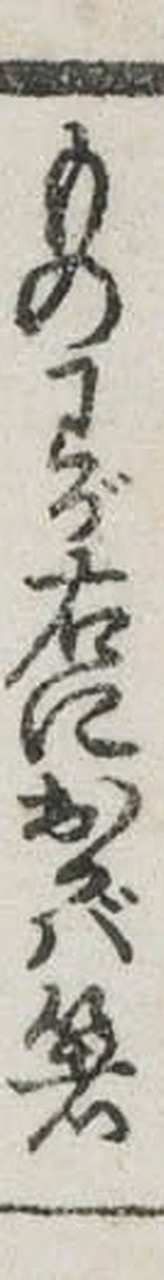ものわが右におかば箸
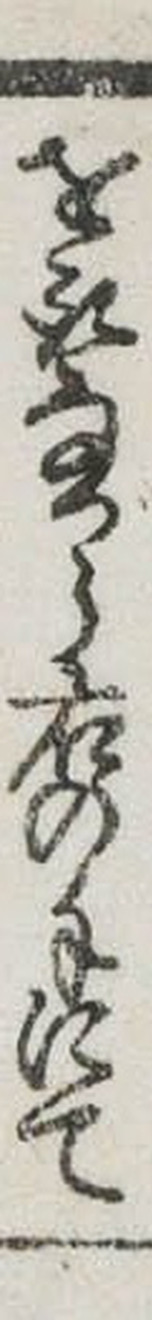を取ながら右の手にて
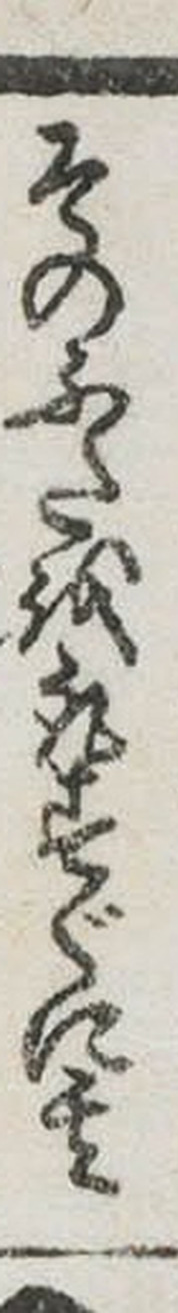そのふたを取すぐに其
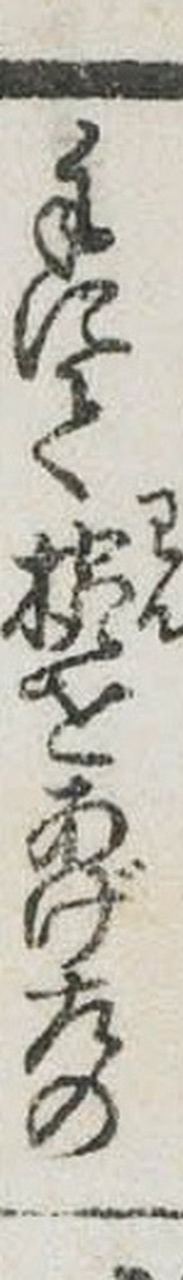手にて椀をあげ左の
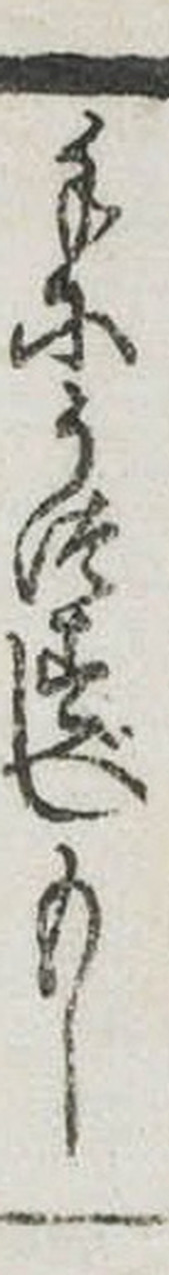手にうつすべしもし
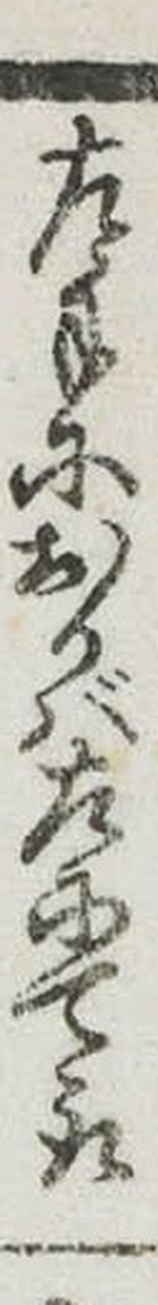左手におかば左にて取
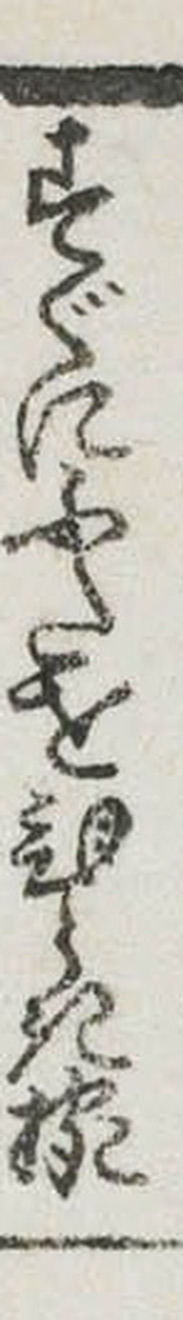すぐにふたをひらき椀
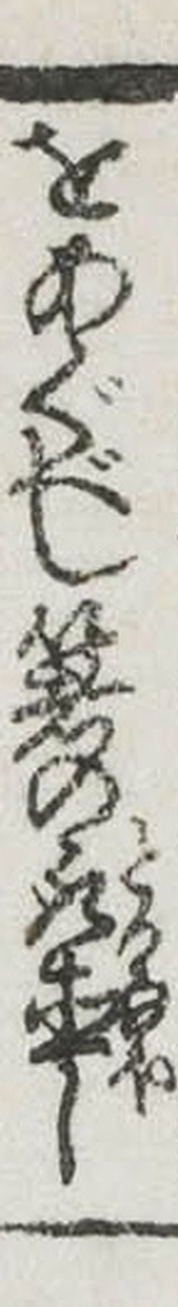をあぐべし箸の取直し
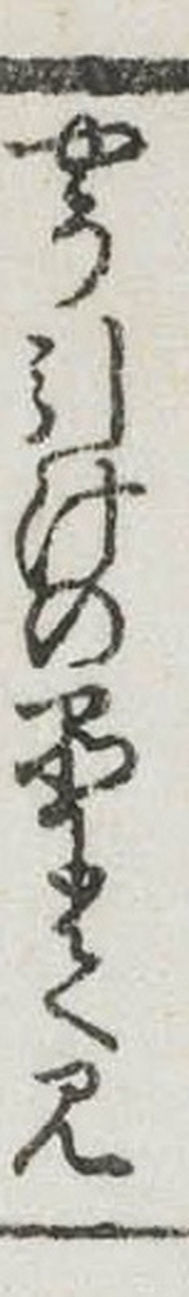やう引汁の所にて見
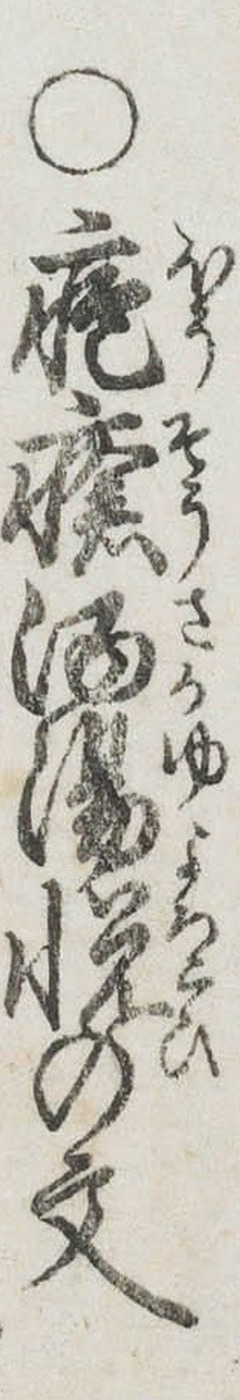○疱瘡酒湯悦の文
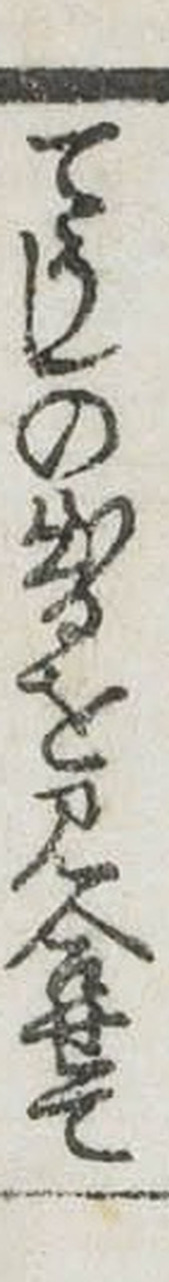てうしの出るを見合せて
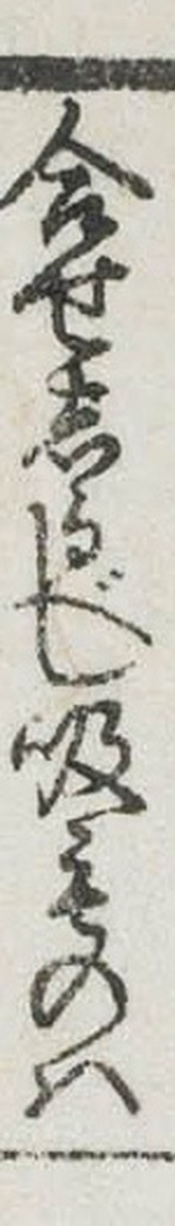合せしるべし吸ものは
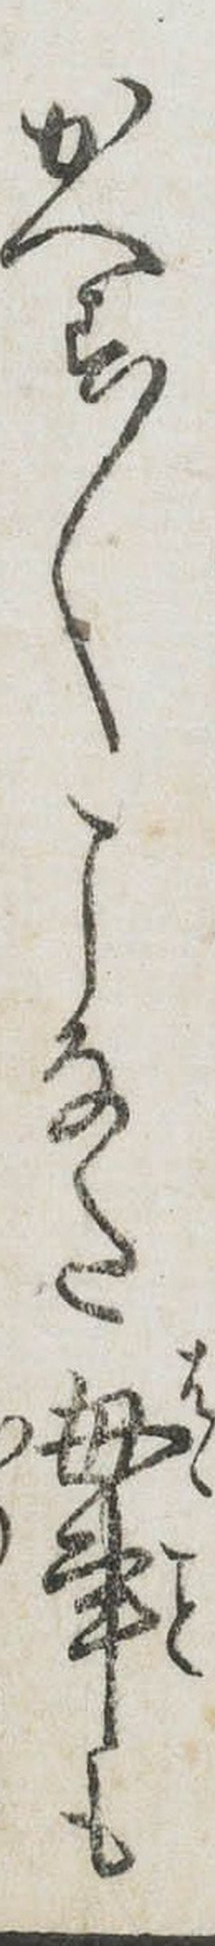かへす〳〵こなた母事も
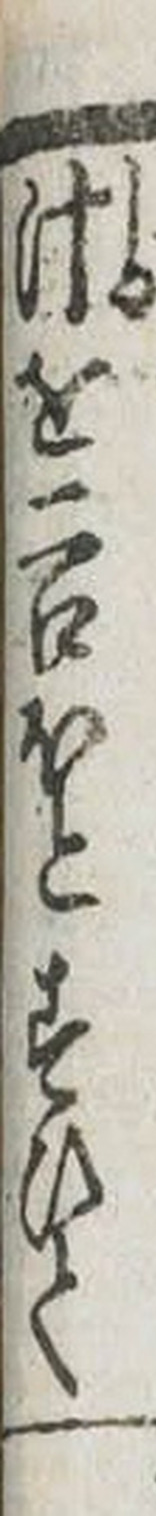汁を二口ほとすひて
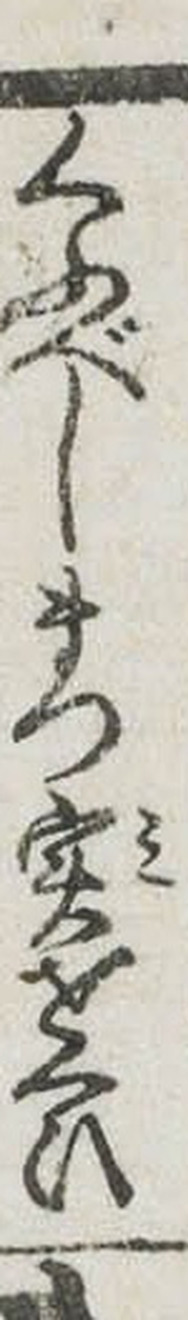くふべしまつ実をくひ
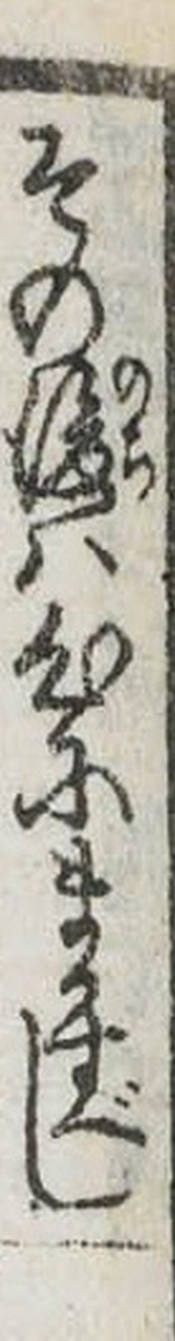その後は心にまかすべし
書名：頭書萬用婦人手紙之文言
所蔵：東京学芸大学教育コンテンツアーカイブ
